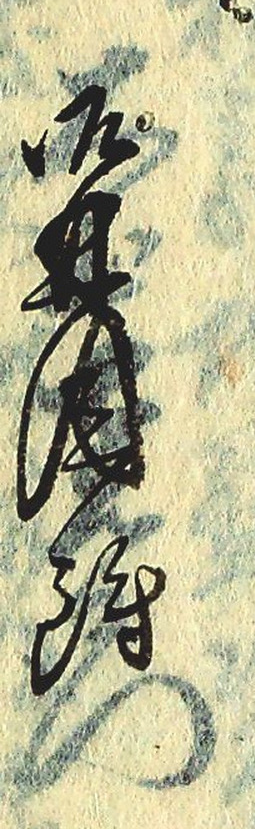御林目附
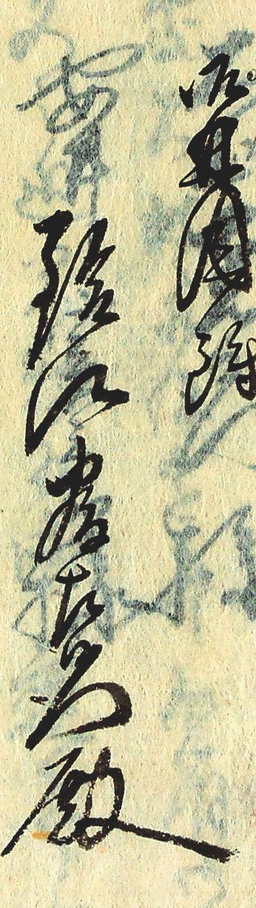鈴江為左衛門殿
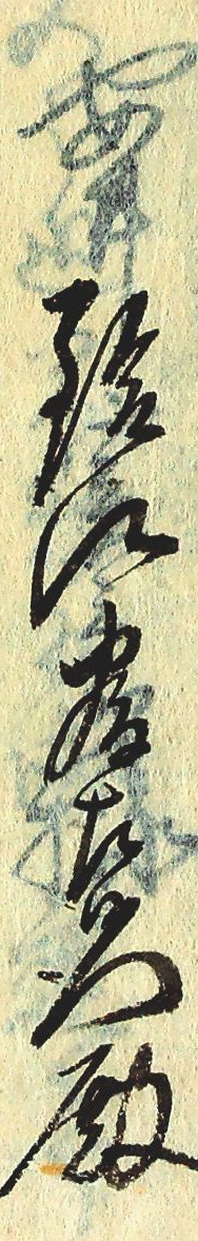鈴江為左衛門殿
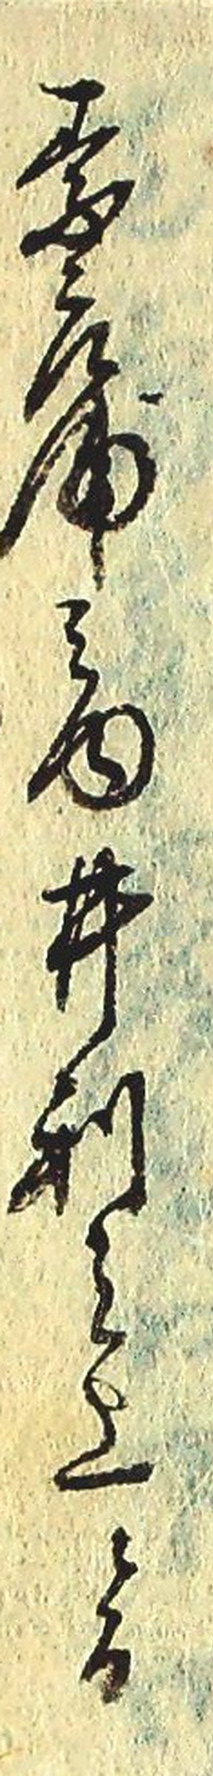素吉浦之内井利之上にて
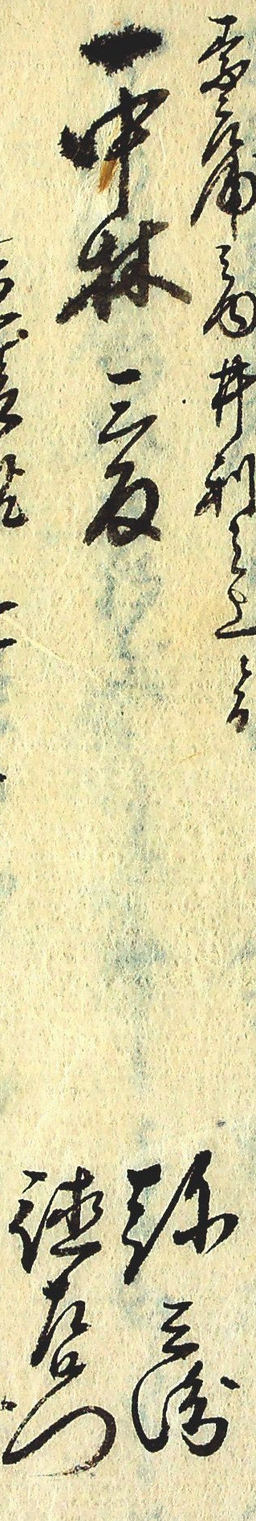一中林三反弥兵衛
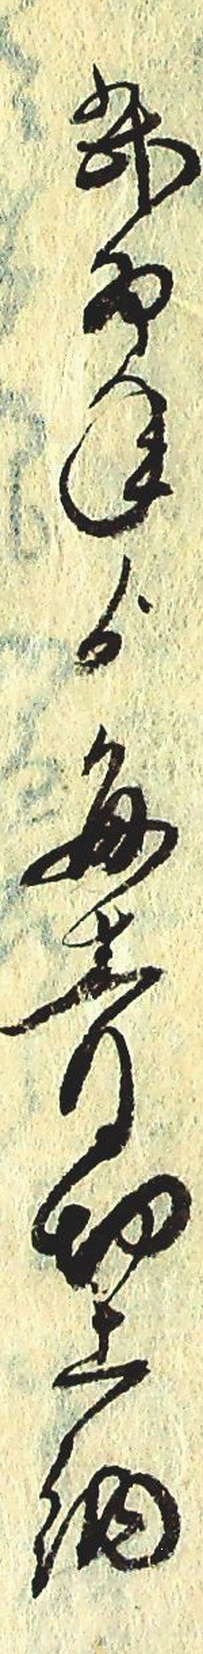当卯年ゟ毎十一月切上納
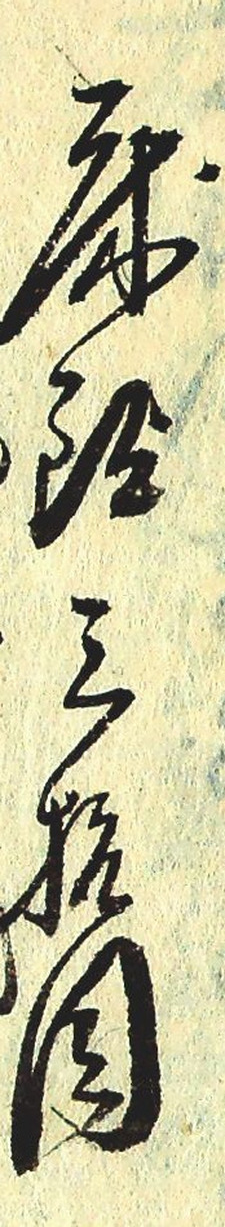床銀三拾目
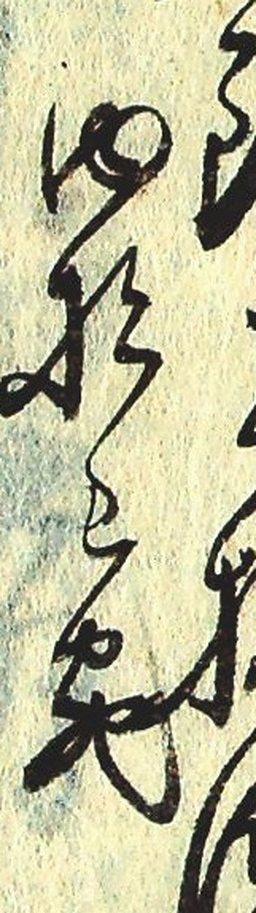内拾匁宛
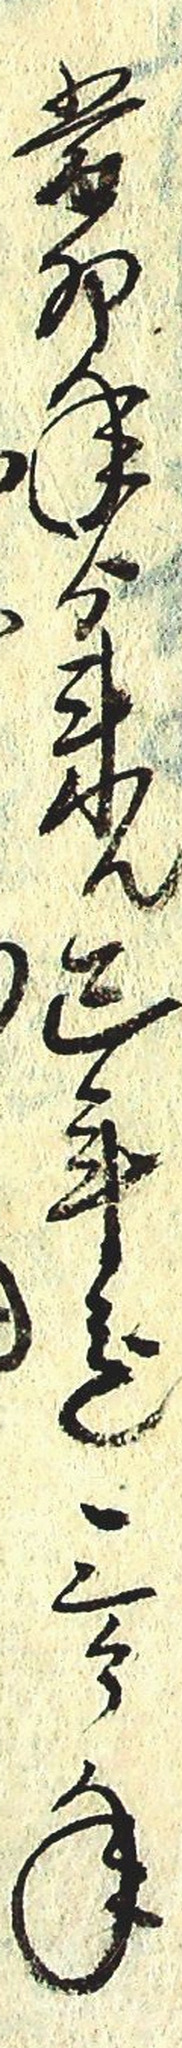当卯年ゟ来る巳年迄三ヶ年
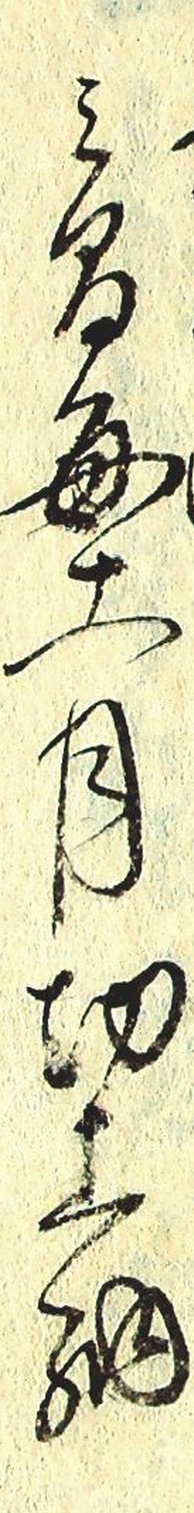之間毎十一月切上納

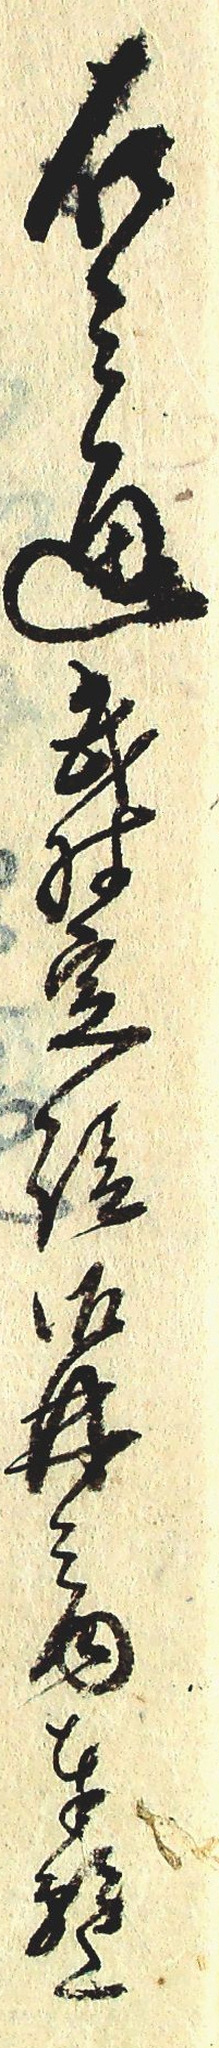右之通当村定請御林之内奉願上
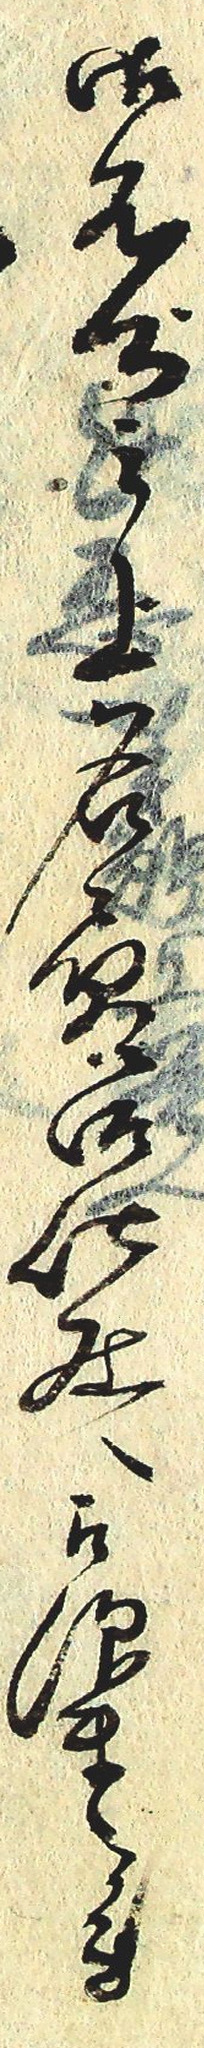御見分之上名負御仕居へ被仰付候付
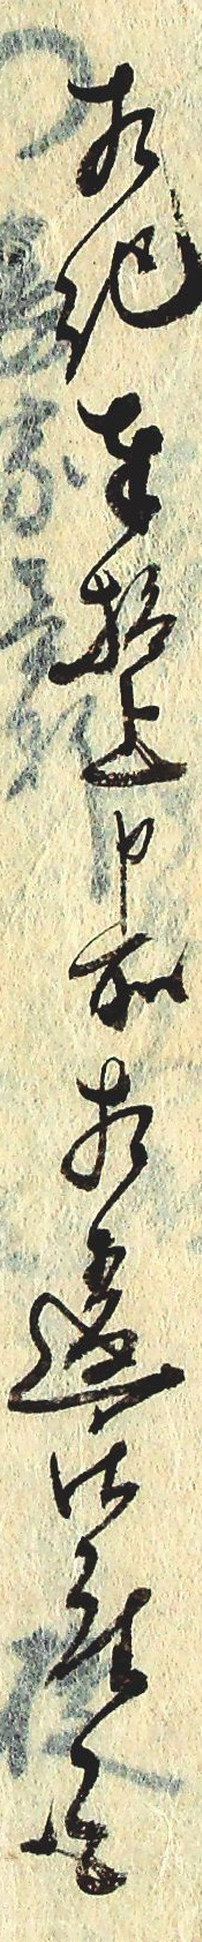相記奉指上申所相違御座候
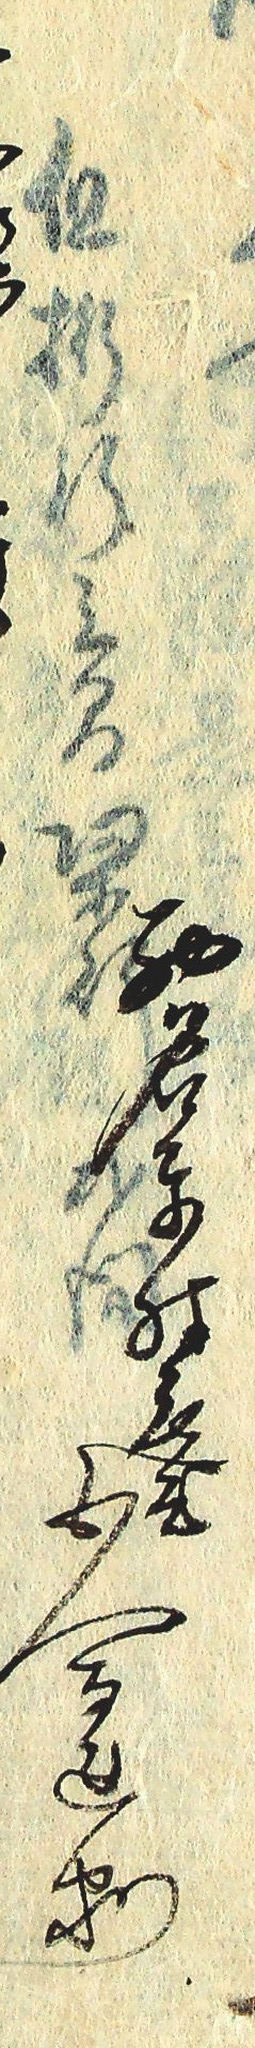西名東村庄屋
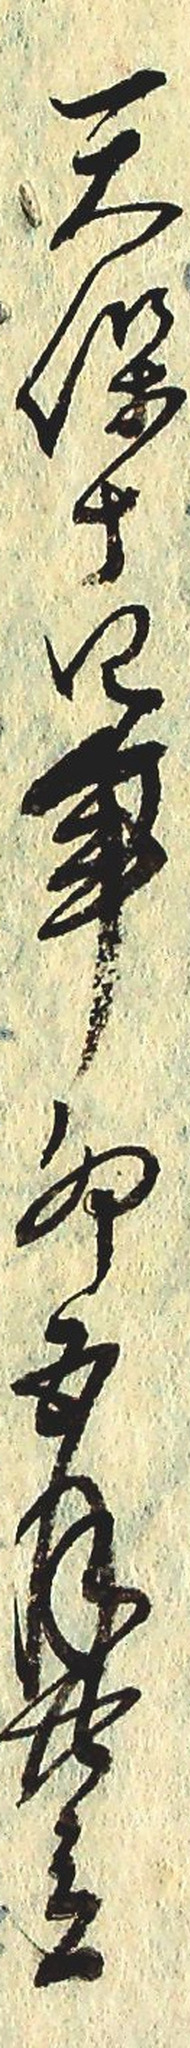天保十四年卯五月廿三日
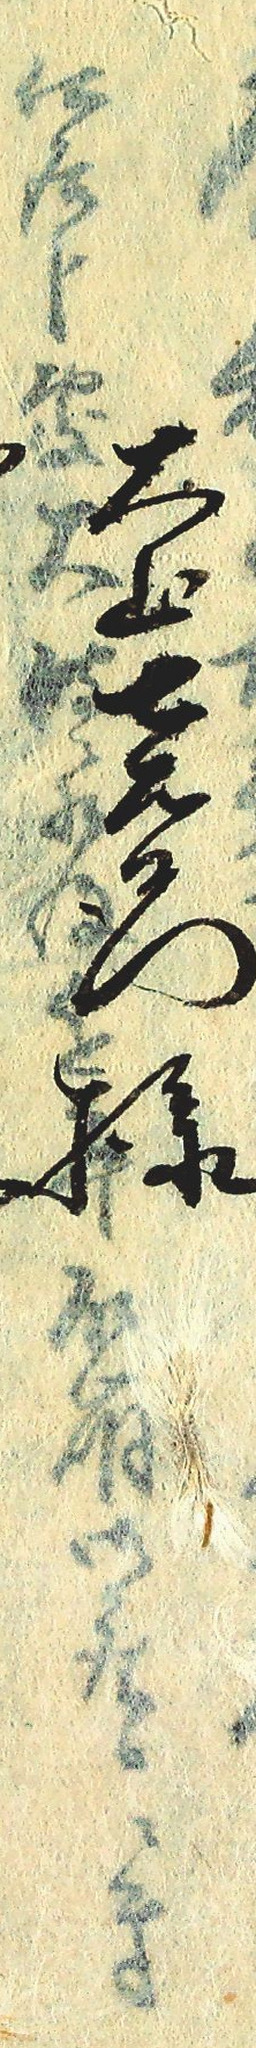大山七右衛門様
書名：諸御願書控(弐番）
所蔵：鳴門教育大学 Naruto University of Education
